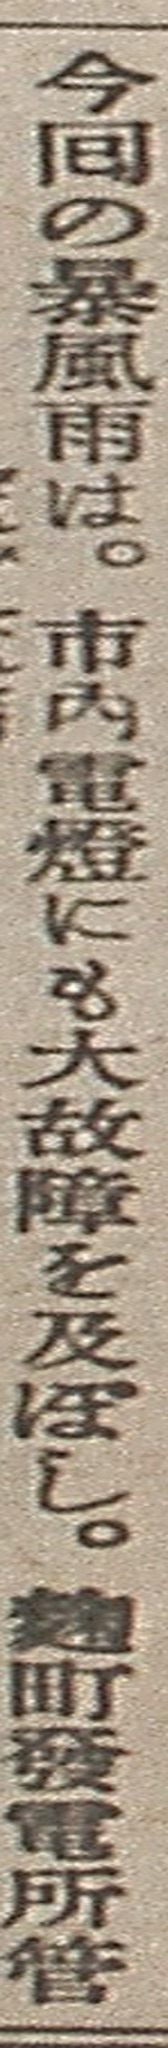今回の暴風雨は。市内電燈にも大故障を及ぼし。麹町発電所管
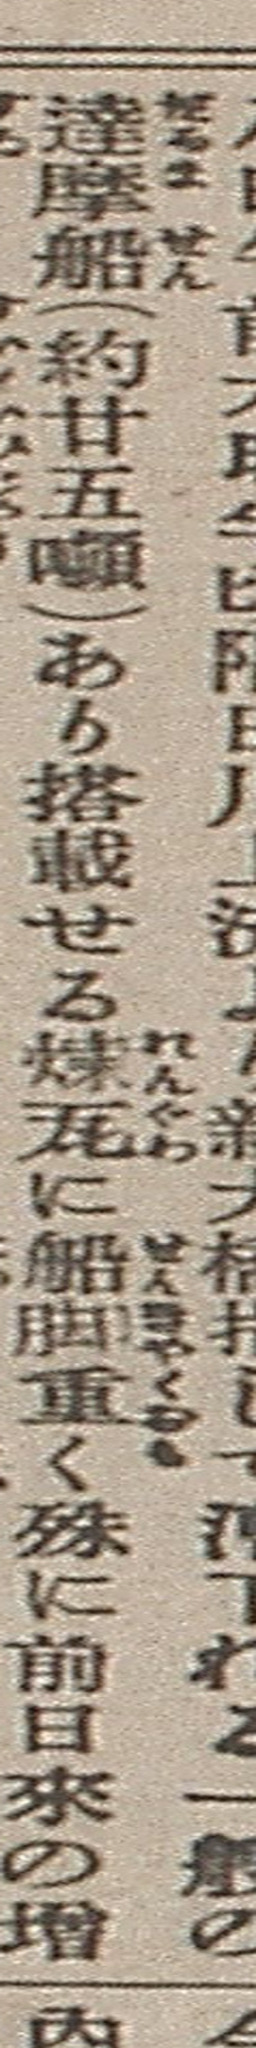達摩船あり搭載せる煉瓦に船脚重く殊に前日来の増
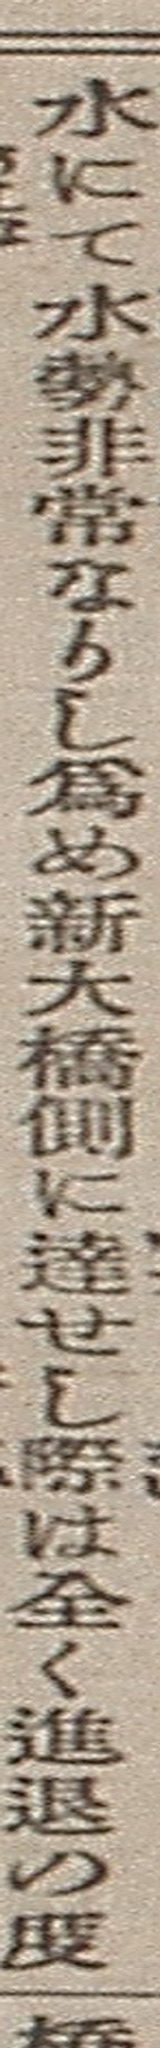水にて水勢非常なりし為め新大橋側に達せし際は全く進退の度を
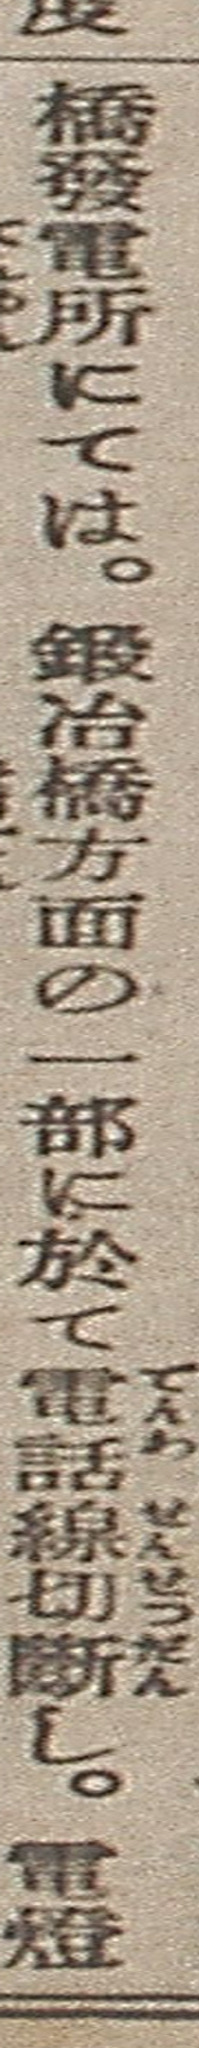橋発電所にては。鍛冶橋方面の一部に於て電話線切断し。電燈
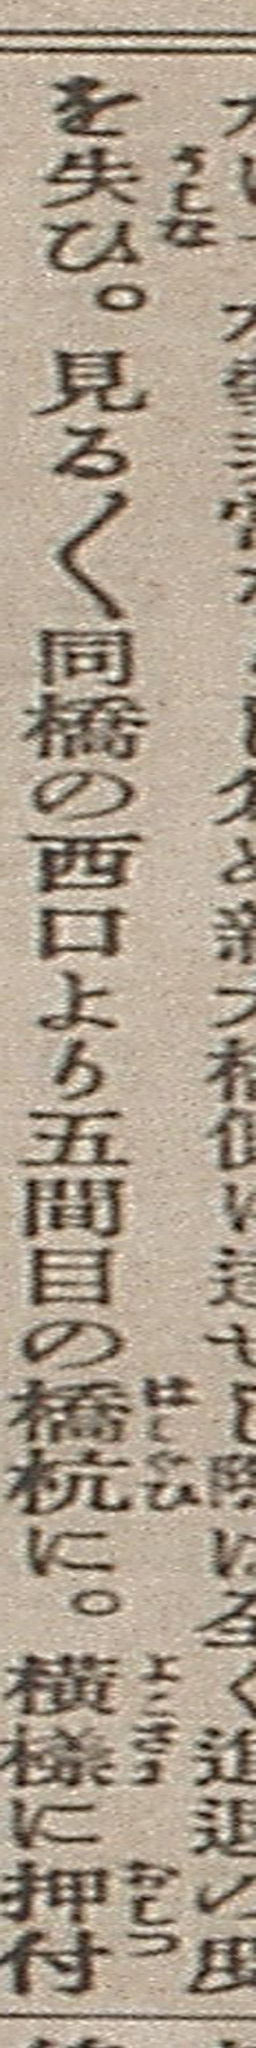失ひ。見る〳〵同橋の西口より五間目の橋杭に。横様に押付
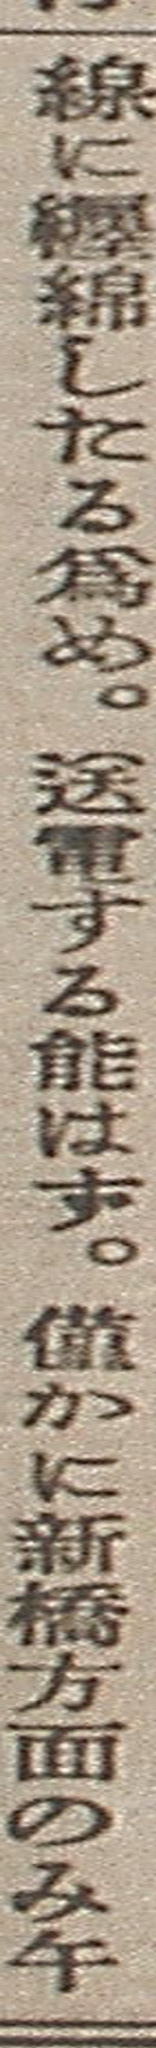線に纏綿したる為め。送電する能はず。僅かに新橋方面のみ午
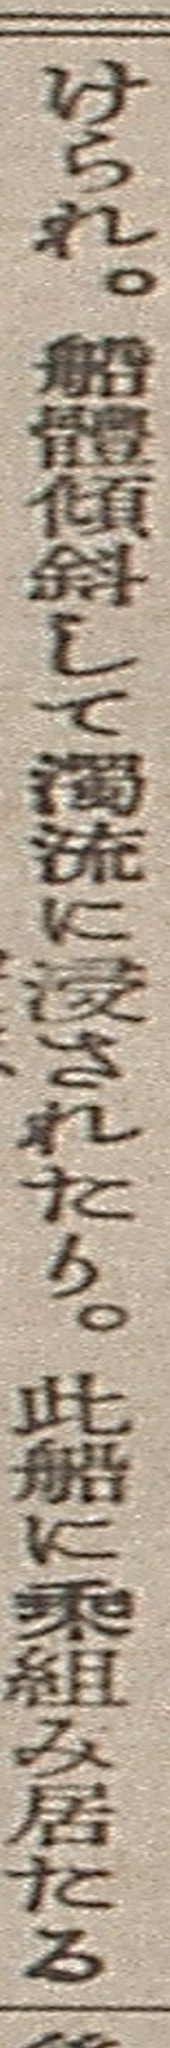けられ。船体傾斜して濁流に浸されたり。此船に乗込み居たる
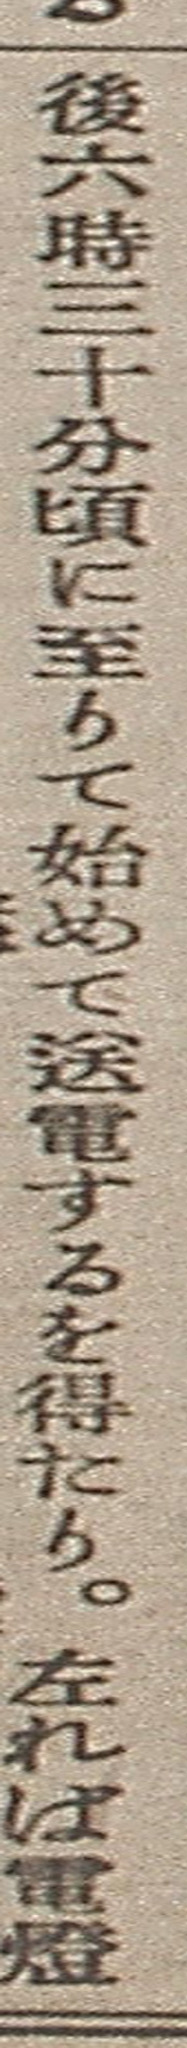後六時三十分頃に至りて始めて送電するを得たり。されば電燈
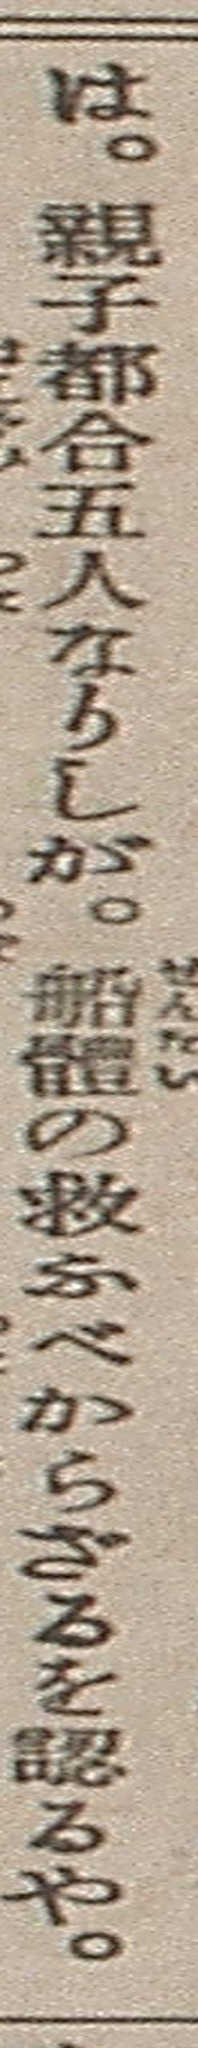は。親子都合五人なりしが。船体の救ふべからざるを認るや。
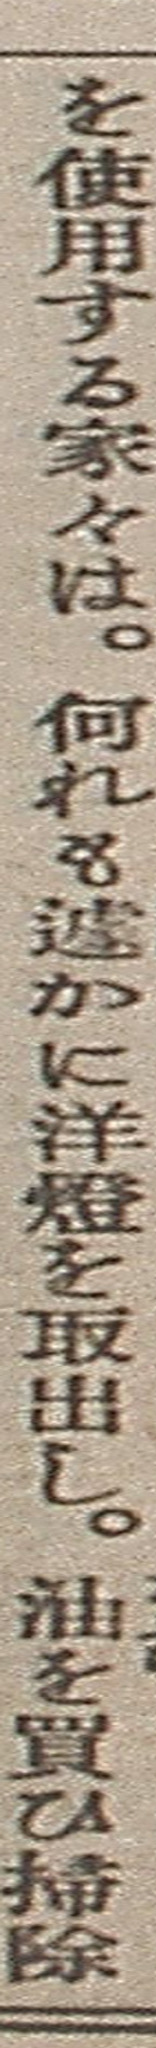を使用する家々は。何れも遽かに洋燈を取出し。油を買ひ掃除
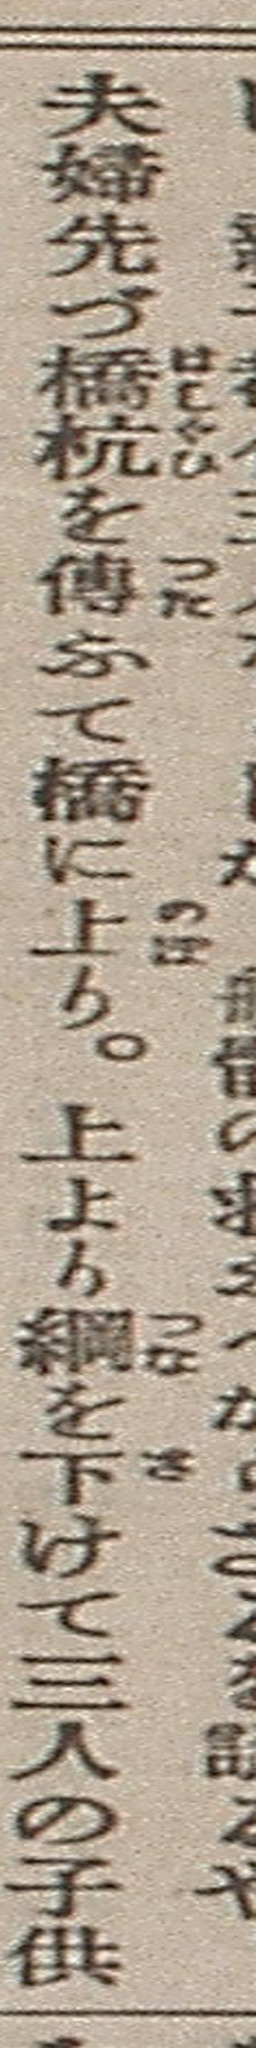夫婦先づ橋杭を伝ふて橋に上り。上より綱を下げて三人の子共
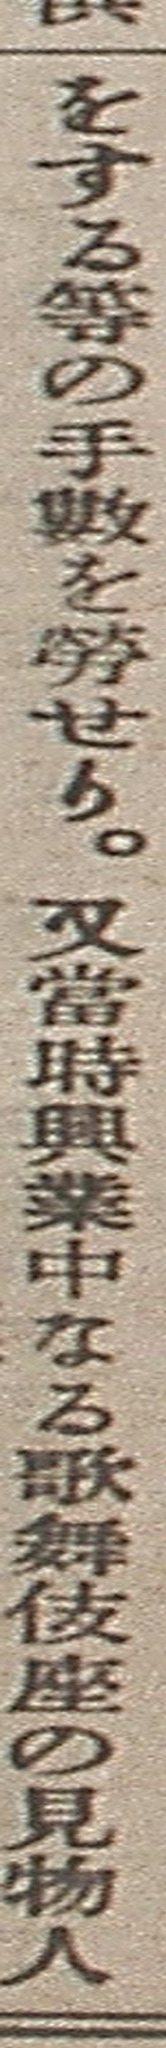をする等の手数を労せり。又当時興行中なる歌舞伎座の見物人
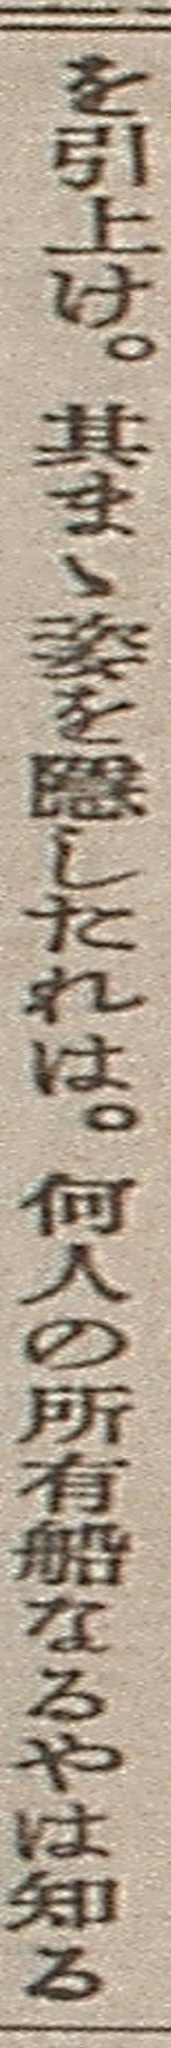を引上け。其まゝ姿を隠したれは。何人の所有船なるやは知る
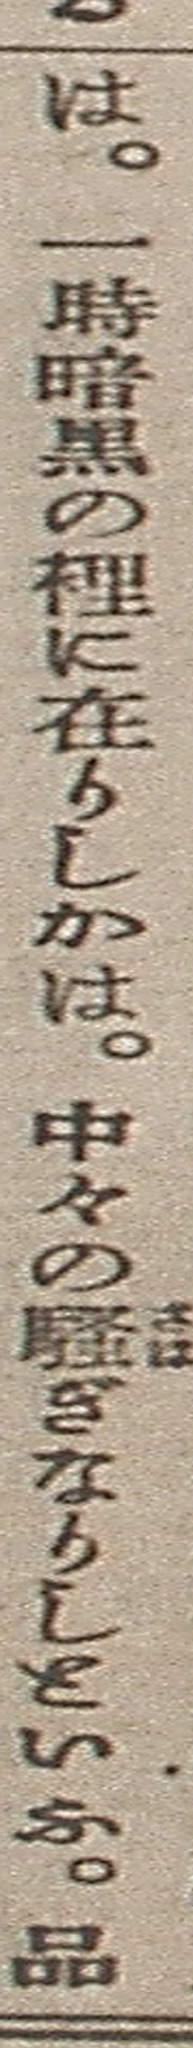は。一時暗黒の裡に在りしかは。中々の騒ぎなりしといふ。品
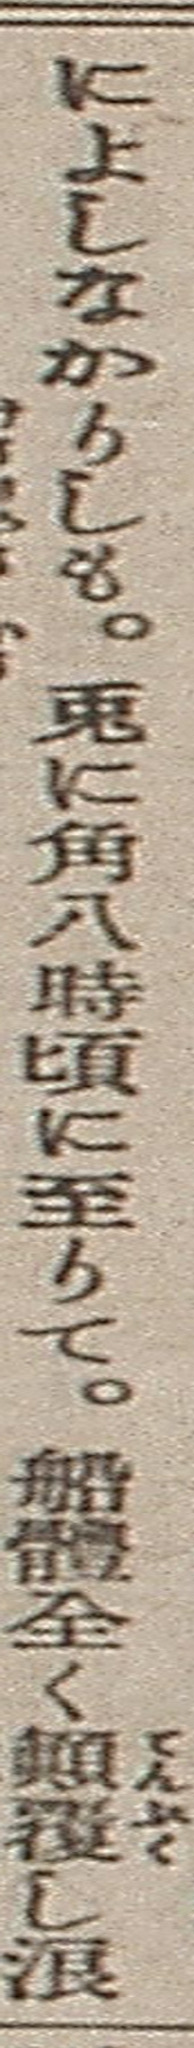のよしなかりしも。兎に角八時頃に至りて。船体全く顛覆し浪
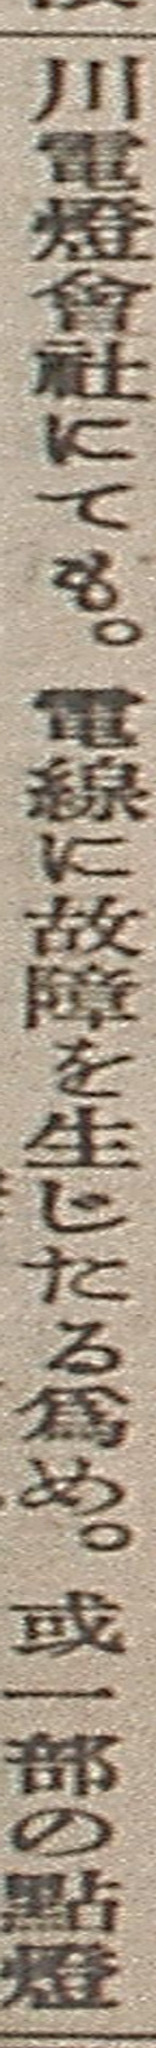川電燈会社にても。電線に故障を生じたる為め。或一部の点燈
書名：風俗畫報臨時増刊第百九十九號　明治三十二年十月各地災害圖會（前編之續）
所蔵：東京大学地震研究所図書室 Earthquake Research Institute Library, The University of Tokyo, JAPAN
